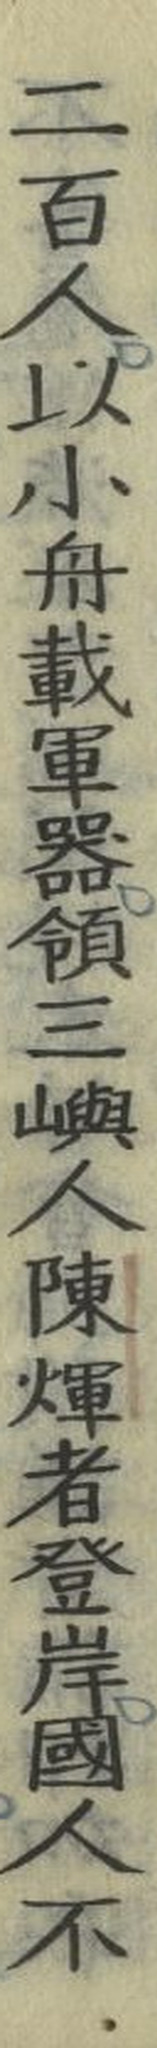二百人。以小舟載軍器。領三嶼人陳煇者登岸。國人不
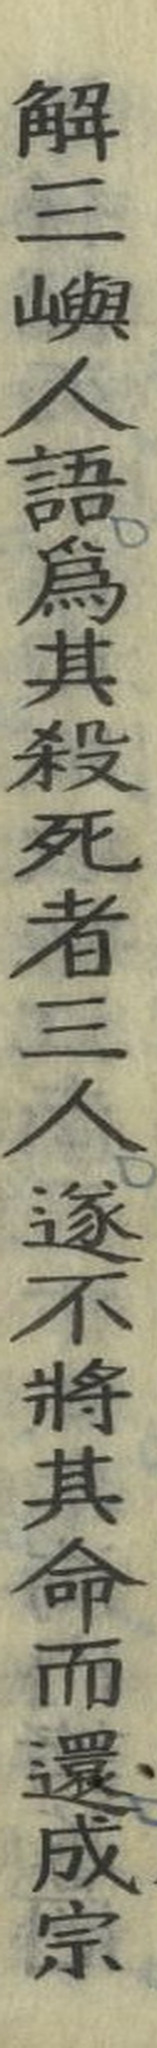解三嶼人語。爲其殺死者三人。遂不將其命而還。成宗
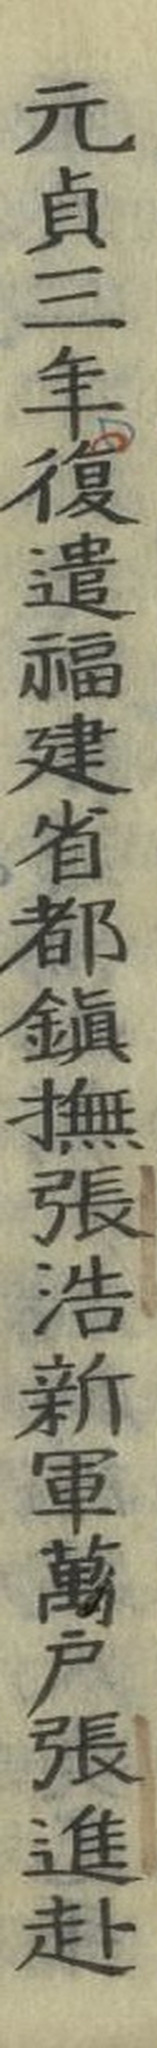元貞三年。復遣福建省都鎭撫張浩新軍萬戸張進赴
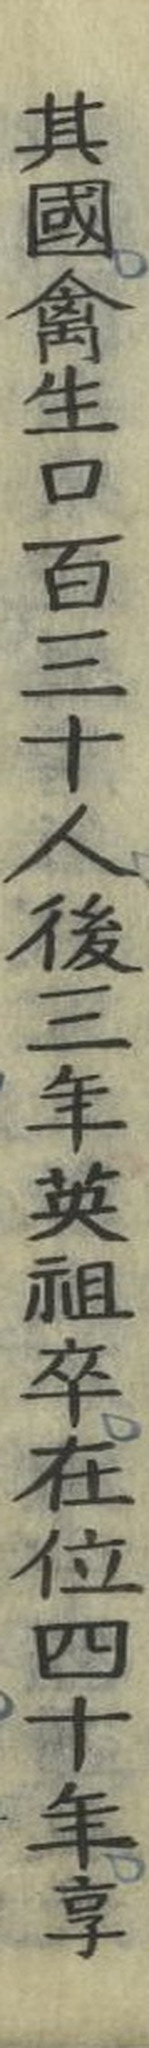其國。禽生口百三十人。後三年英祖卒。在位四十年。享
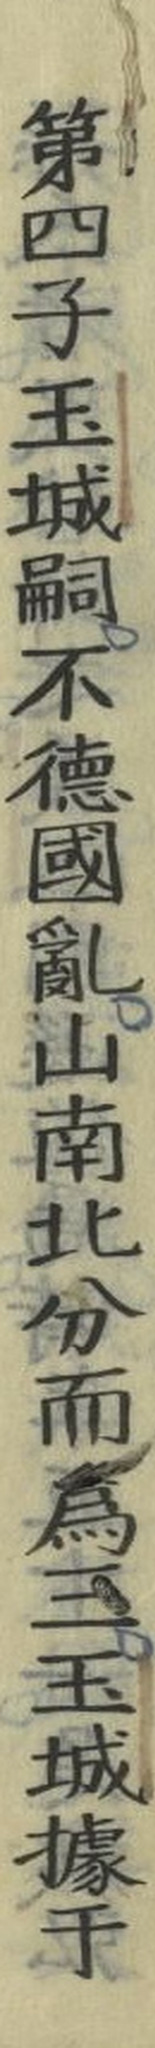第四子玉城嗣。不德國亂。山南北分而爲三。玉城據于

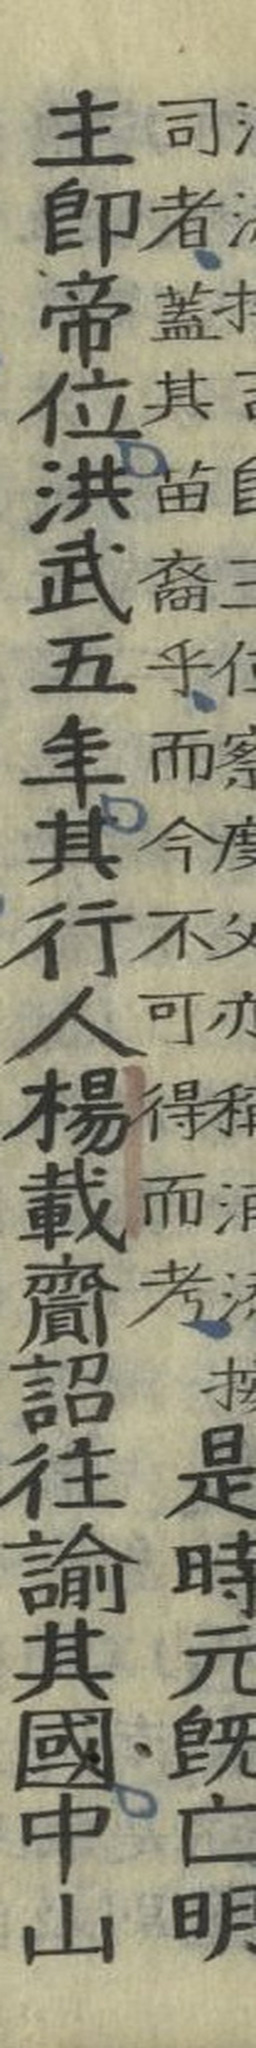主卽帝位。洪武五年。其行人楊載齎詔往諭其國。中山
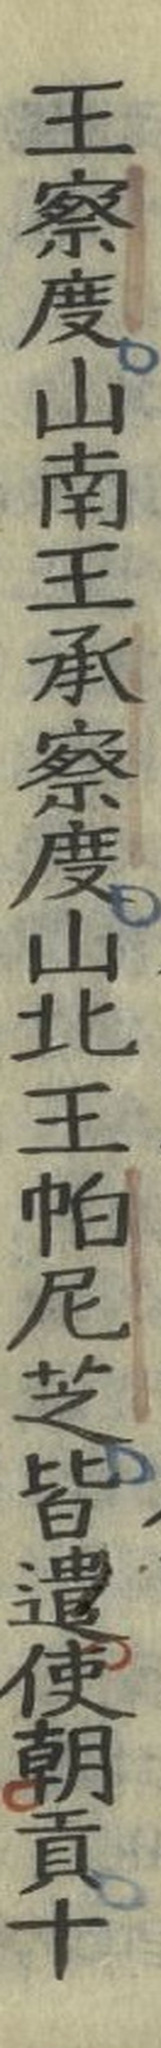王察度。山南王承察度。山北王帕尼芝。皆遣使朝貢。十
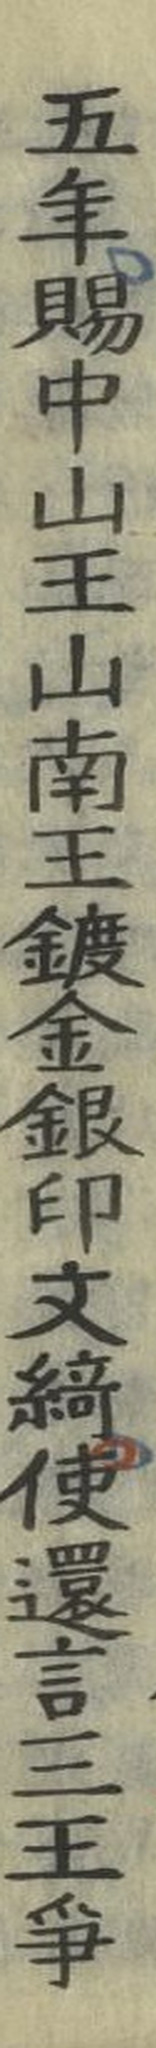五年。賜中山王山南王鍍金銀印文綺。使還言三王爭
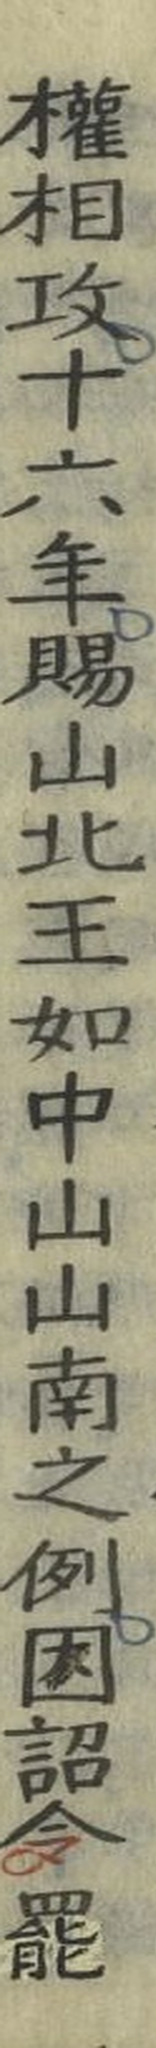權相攻。十六年。賜山北王如中山山南之例。因詔令罷
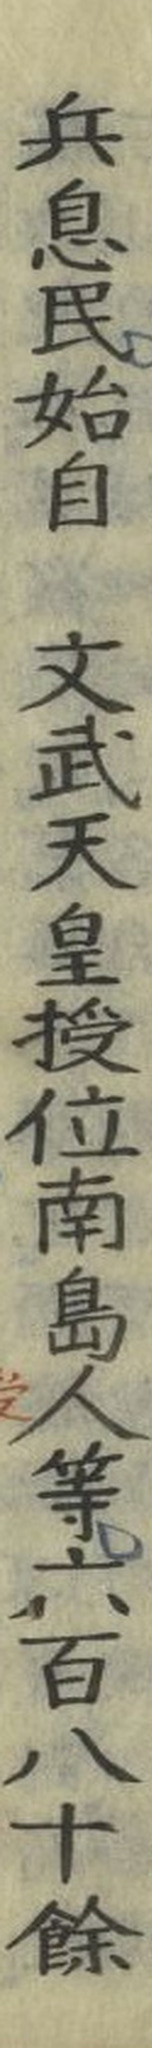兵息民。始自文武天皇授位南島人等。六百八十餘
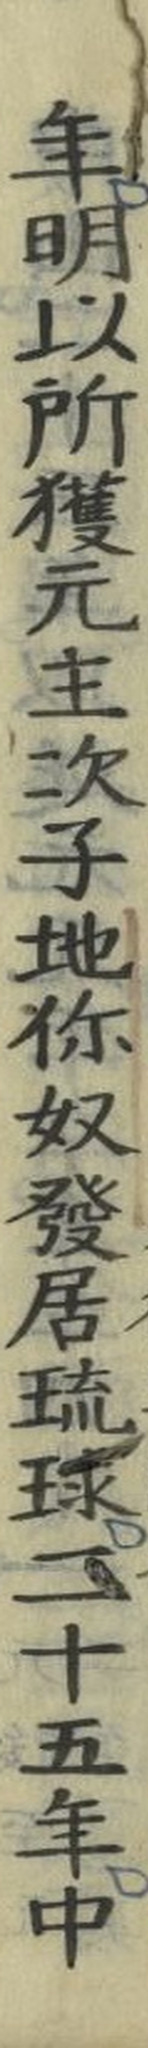年。明以所獲元主次子地你奴發居琉球。二十五年。中
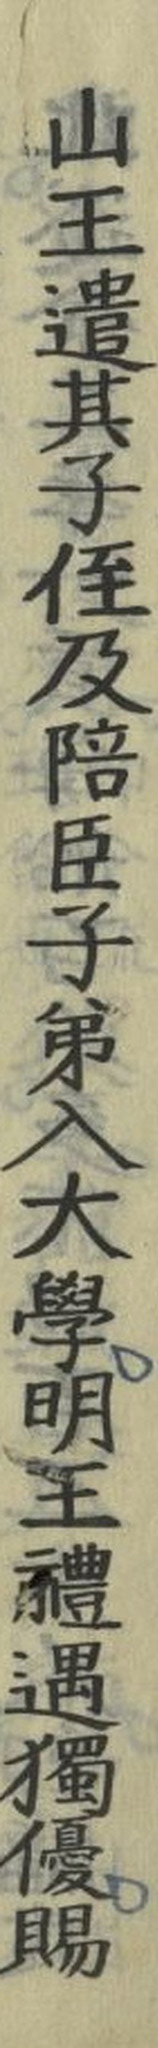山王遣其子侄及陪臣子弟入大學。明王禮遇獨優。賜
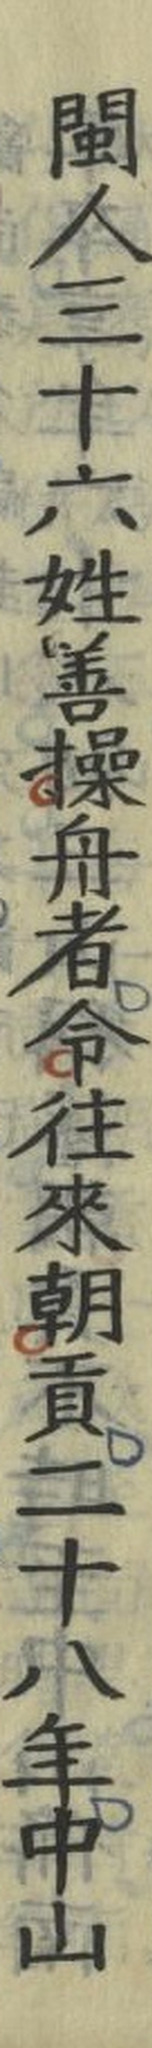閩人三十六姓善操舟者。令往來朝貢。二十八年。中山
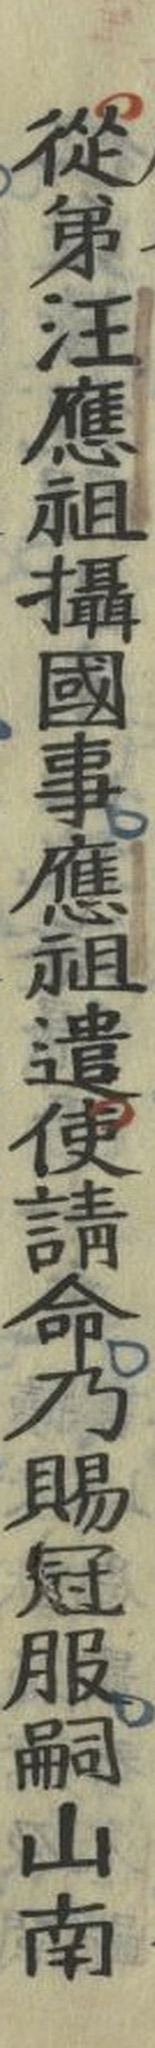從弟汪應祖攝國事。應祖遣使請命。乃賜冠服。嗣山南

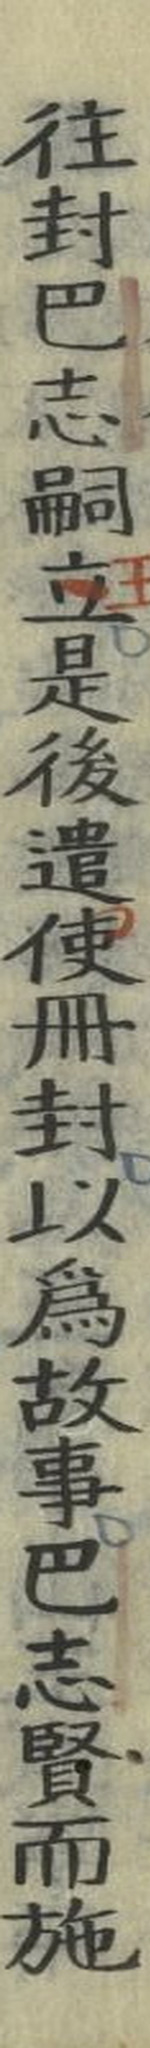往封巴志嗣立王。是後遣使冊封。以爲故事。巴志賢而施
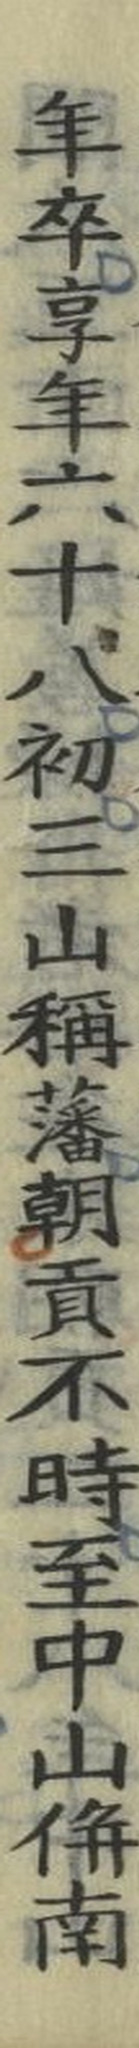年卒。享年六十八。初三山稱蕃。朝貢不時。至中山併南
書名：南島志
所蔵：University of the Ryukyus Library
